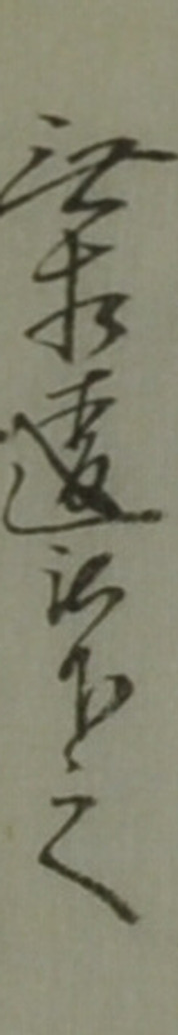無相違被下之
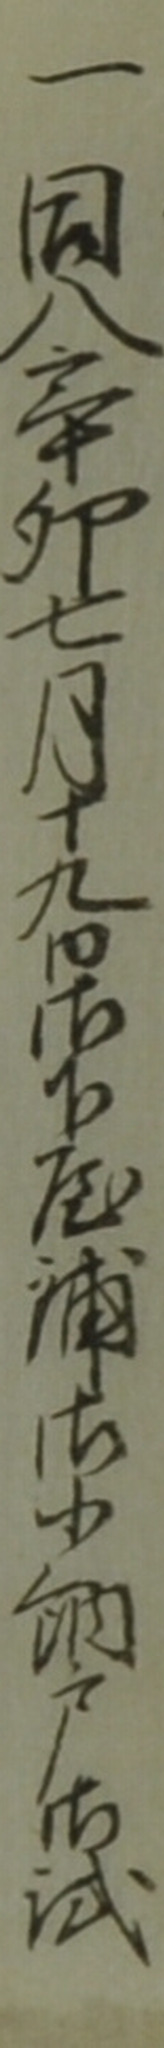一同八辛卯七月十九日御下屋敷御小納戸御試
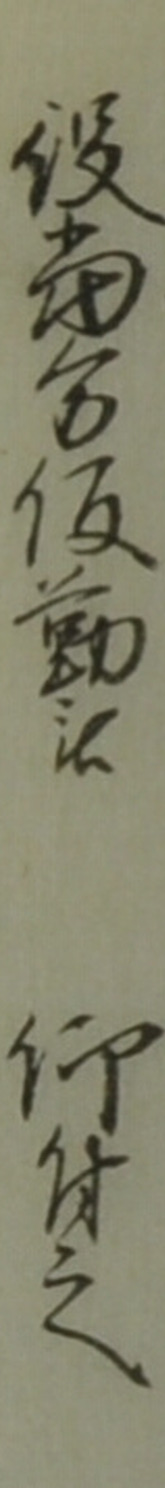役当方仮勤被仰付之
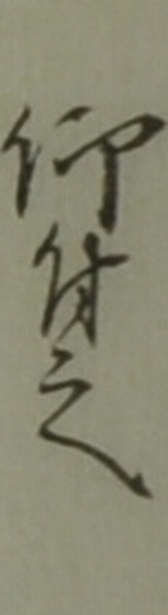仰付之

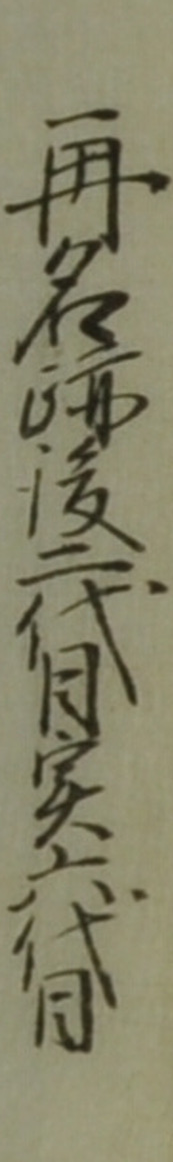再名跡後二代目実六代目
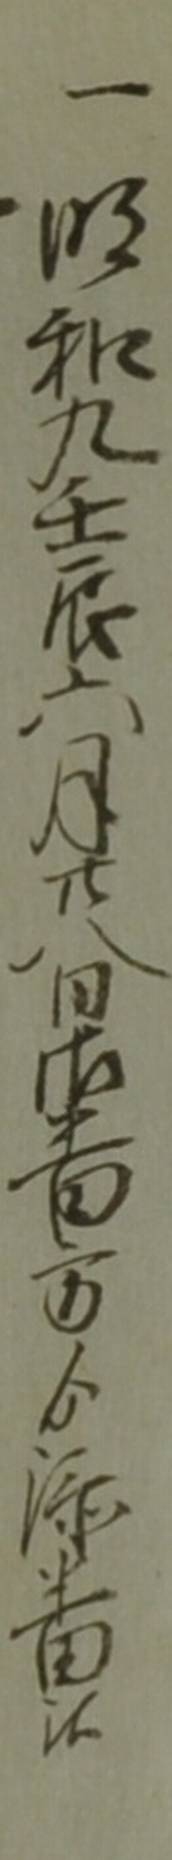一明和九壬辰六月廿八日御番方より添番被
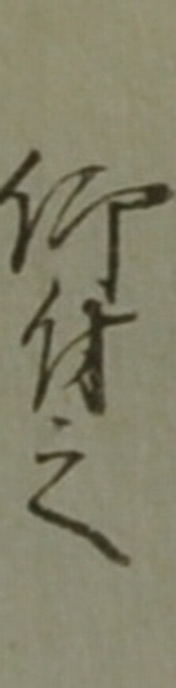仰付之
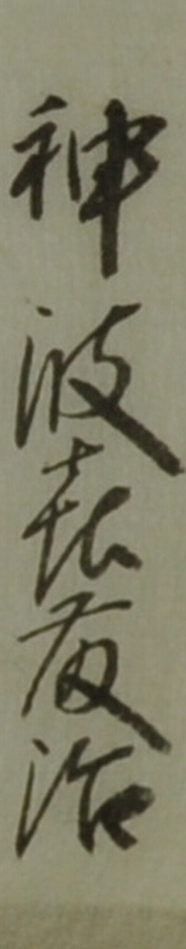神波喜藤治
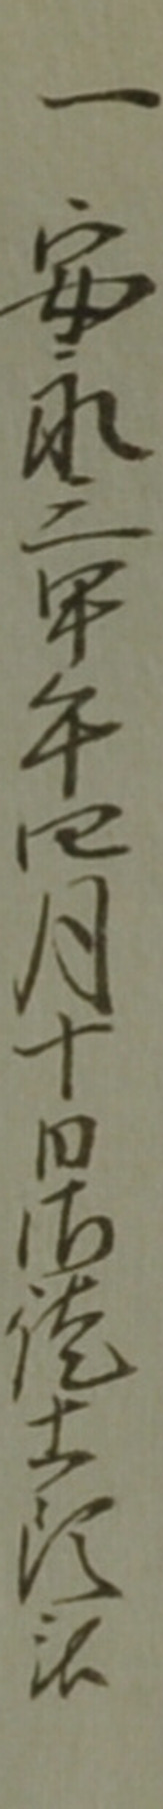一安永三甲午四月十四日御徒士頭被
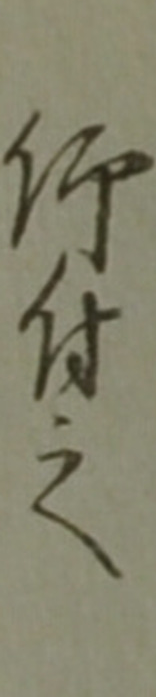仰付之
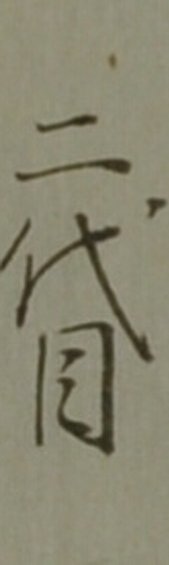二代目
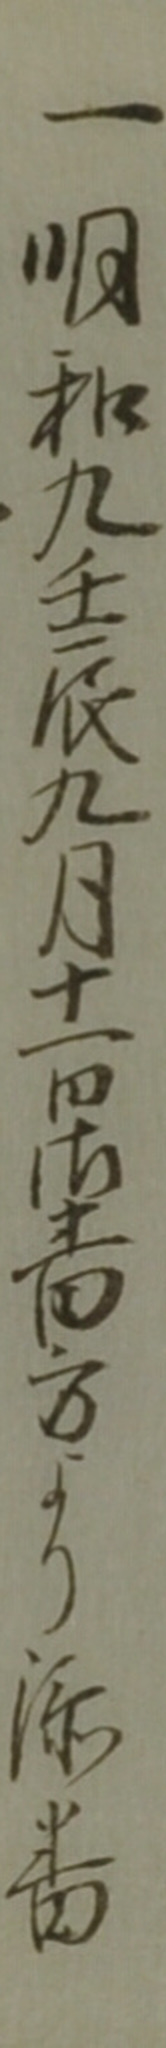一明和九壬辰九月十一日御番方より添番
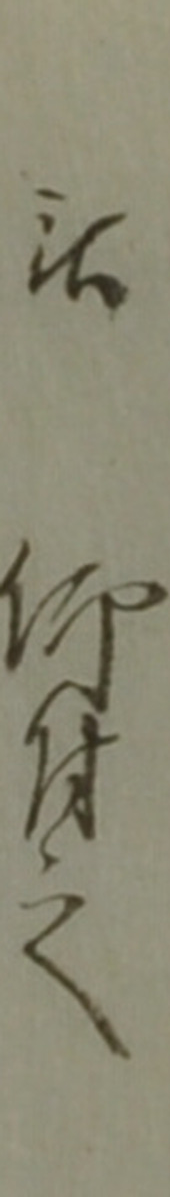被仰付之
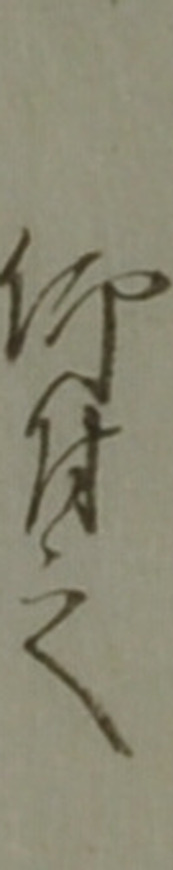仰付之
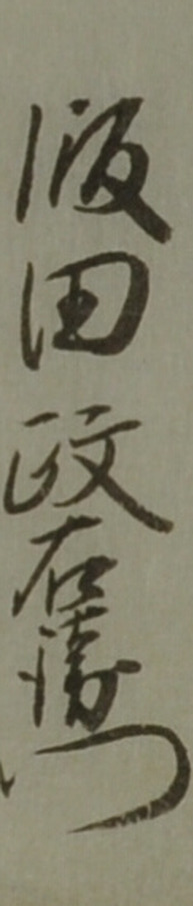飯田政右衛門
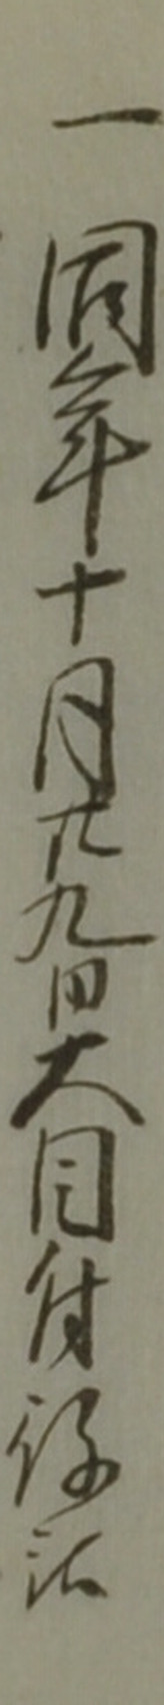一同年十月廿九日大目付役被
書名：諸御役代々録（八）
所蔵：伊那市立高遠町図書館・合同会社AMANE
